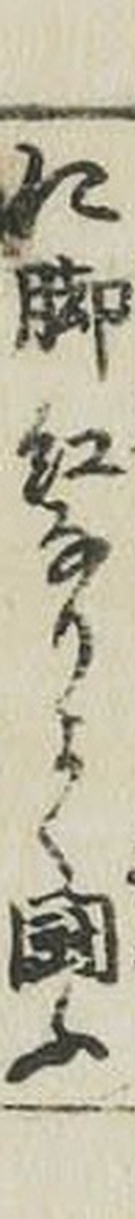に脚紅なりよく闘ふ
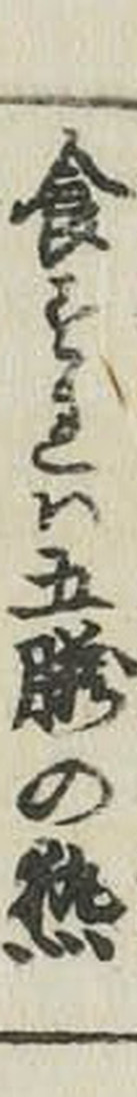食すれは五臓の熱
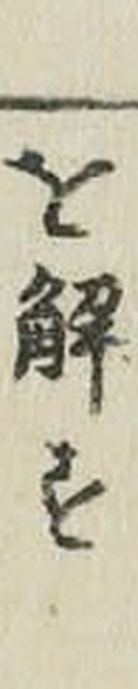を解す
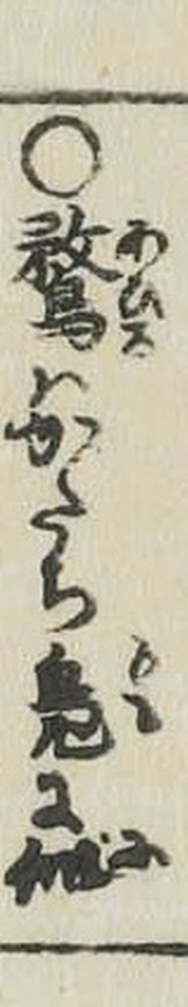○鶩はかたち鳧に似
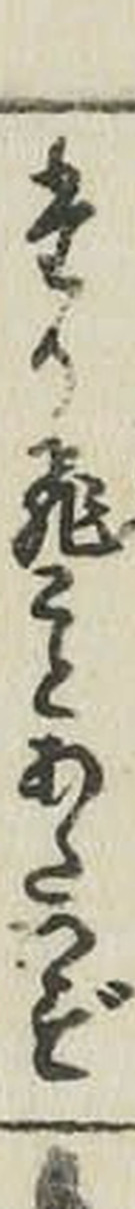たり飛ことあたはず
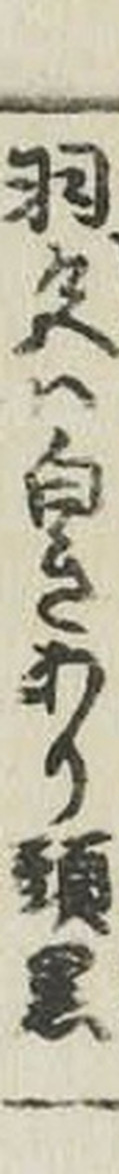羽色は白きあり頭黒
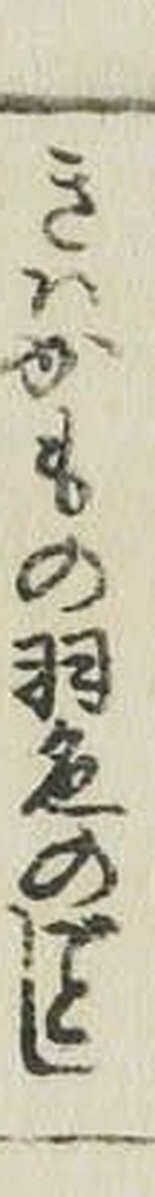きはかもの羽色のごとし
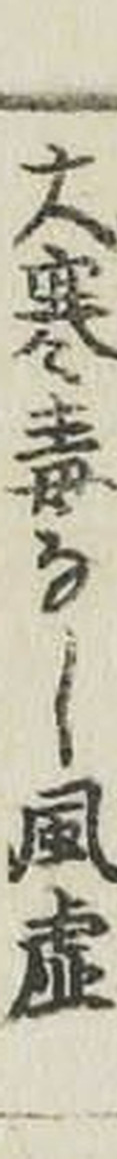大寒毒なし風虚
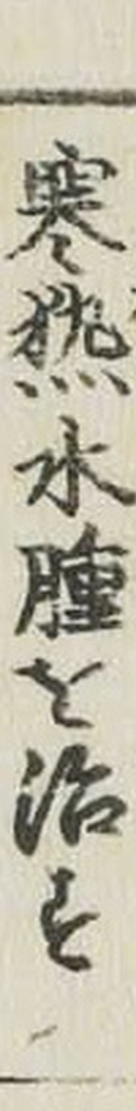寒熱水腫を治す
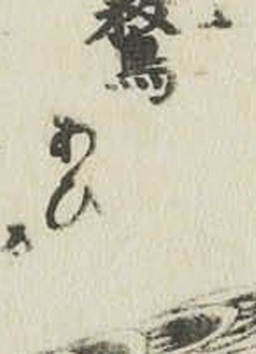あひる
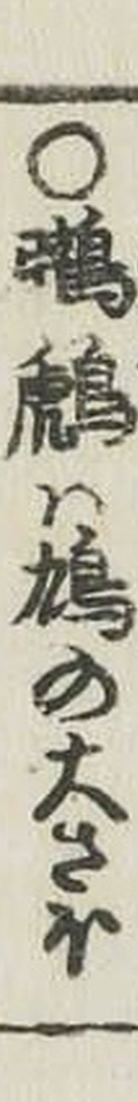○鸊鷉は鳩の大さほ
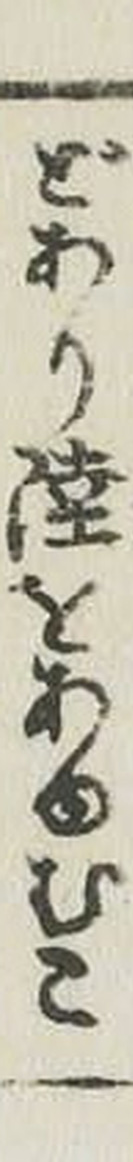どあり陸をあゆむこ
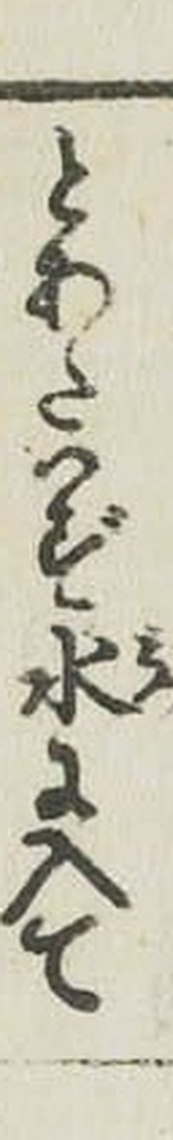とあたはず水に入て
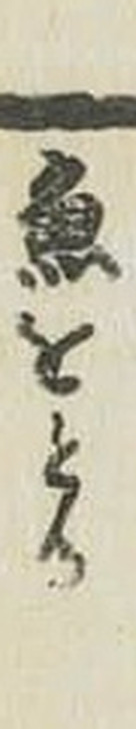魚をとる
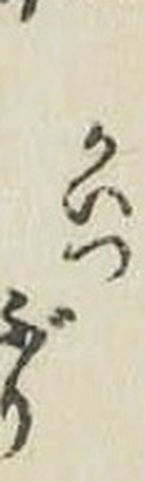かいつぶり
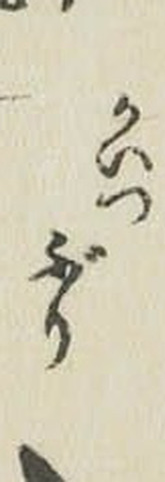かいつぶり
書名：増補頭書訓蒙図彙大成 10巻 6:巻之12-13
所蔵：東京学芸大学教育コンテンツアーカイブ
